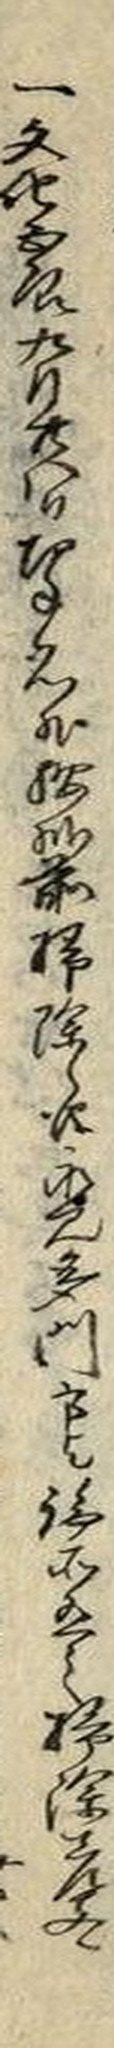一文化五辰九月廿八日切手御門外腰掛前掃除之儀永見多門方と論所有之掃除差支候
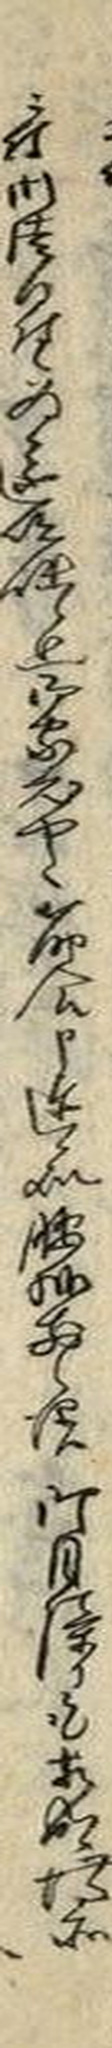に付御徒目付へ為遂吟味候上御家老中へ筋合申達候処腰掛前之儀は御目障りにも相成候場所
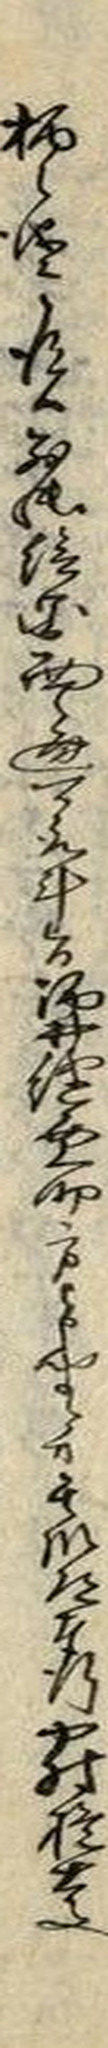柄之儀に候得は別帳絵図面之通可取斗旨酒井縫殿助方被申聞候付其段道奉行中村権大夫
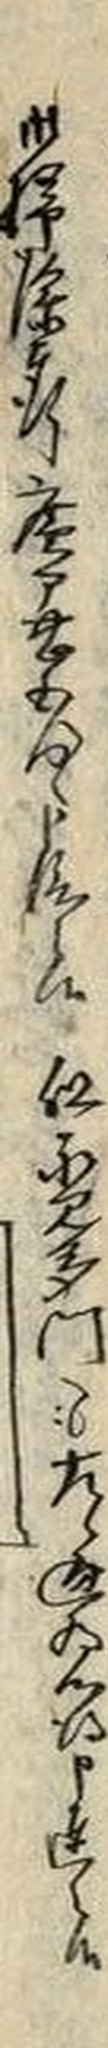御掃除奉行広部甚五右衛門へ申渡し候但永見多門へも左之通為心得申達之候

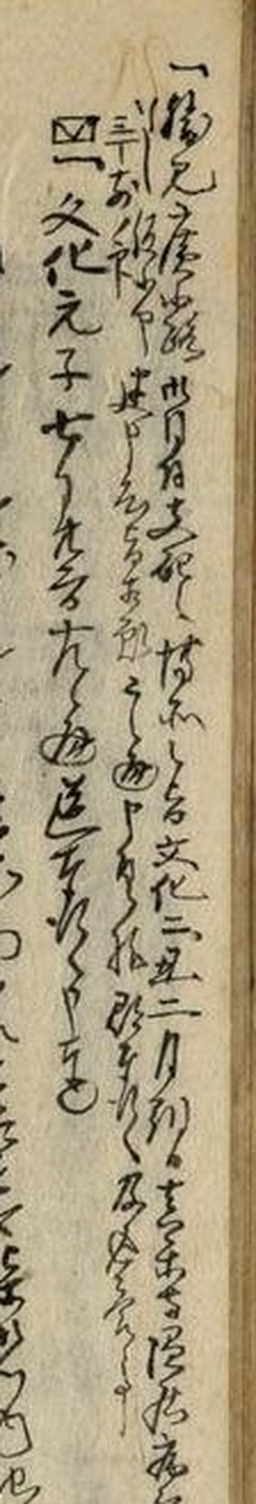いたし仮小や建申度旨相願其通申付候様郡奉行へ及返答候事
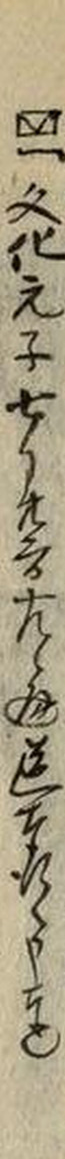一文化元子七月廿二日左之通道奉行へ申達
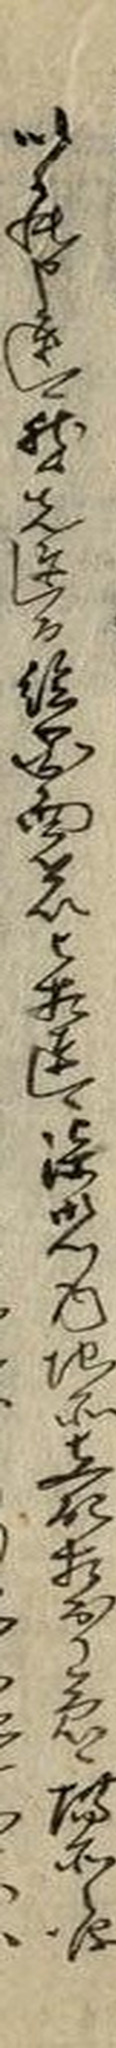以手紙申達候然は先達て絵図面を以被相達候漆御門内地所支配相分り兼候場所之儀
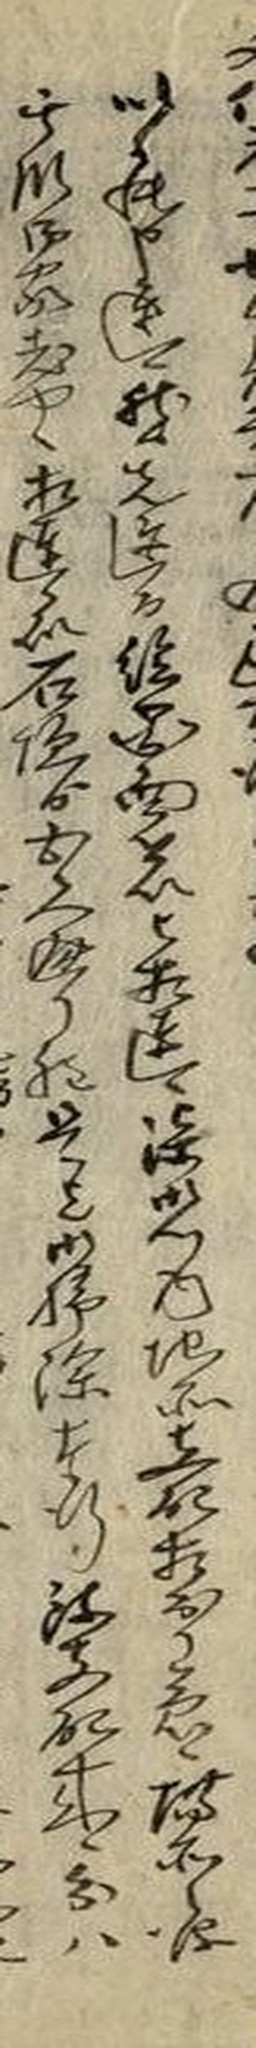其段御家老中へ相達候処石垣ゟ五尺通り程是迄御掃除奉行致支配来候分は
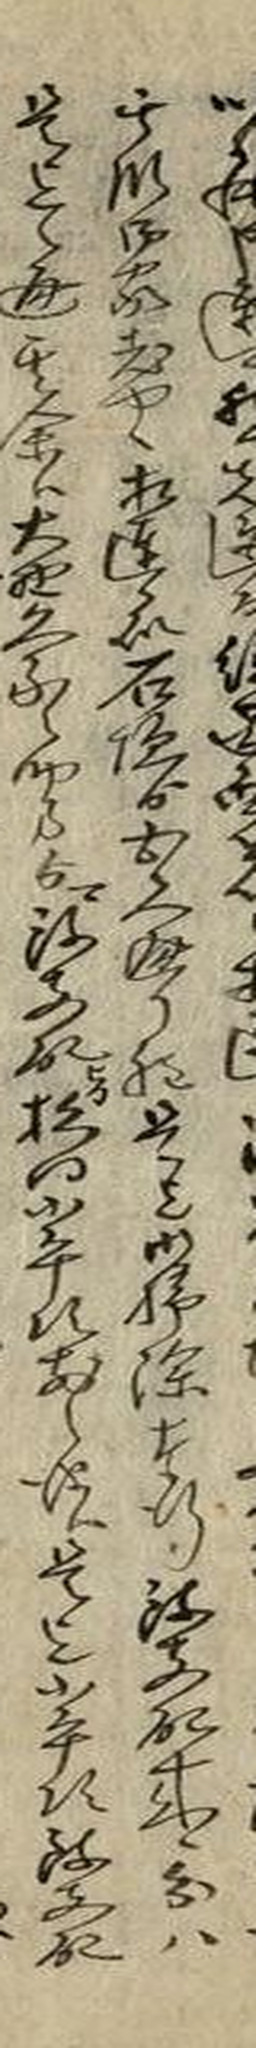是迄之通其余は大野久米之助方ゟ可致支配旨杉田小平次前之儀は是迄小平次致支配
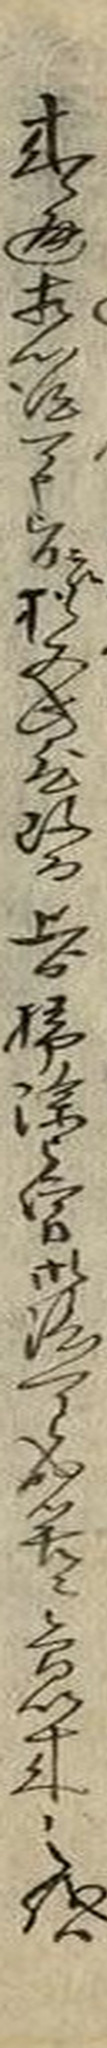来候通相心得可申旨に候猶又此度改て上ゟ掃除被仰付御渡可被成筈に候間以来之儀は
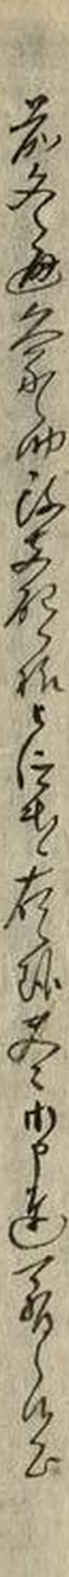前文之通久米之助致支配候様被仰出候右之趣夫々御申達可有之候以上
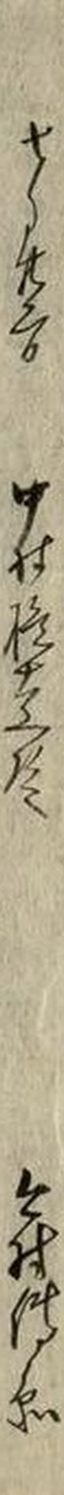七月廿二日中村権大夫殿今村伝兵衛
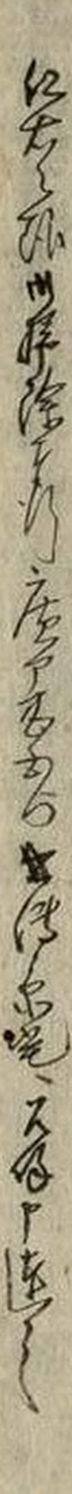但右之趣御掃除奉行広部甚五右衛門伝兵衛宅へ召呼申達之
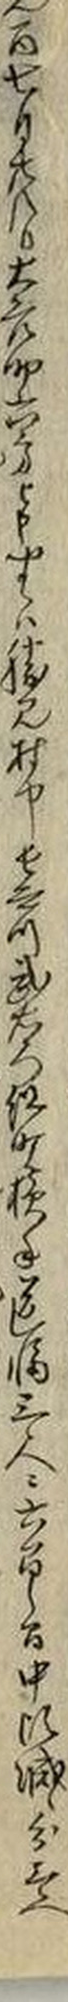一寛保元酉七月廿八日大谷助六方被申聞候は勝見村中長谷川武右衛門組町横手道幅三尺に六間之間中頃減候分壱
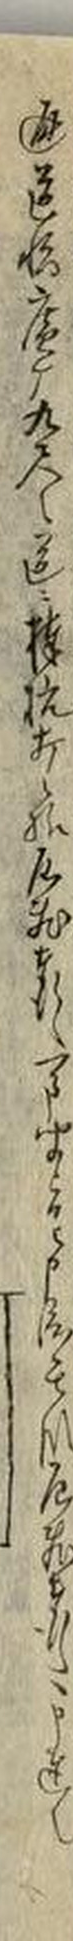通道幅広ケ九尺之道に棒杭打候様屋敷奉行へ可申聞旨被申渡其段屋敷奉行へ申達之
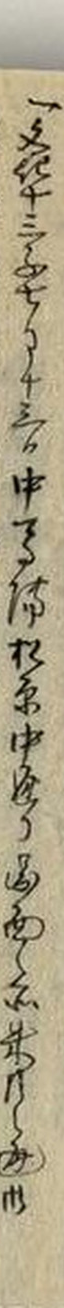一文化十三子七月十三日中馬場松原中通り図面之所朱引之通御
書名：御城下諸事之部
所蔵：福井県文書館 Fukui Prefectural Archives
